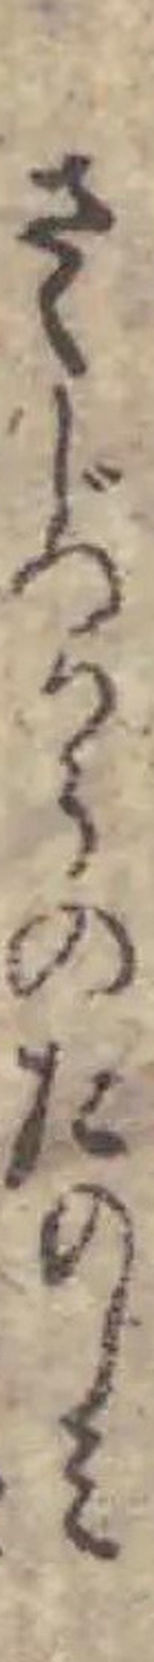さくじつからのたのしみ
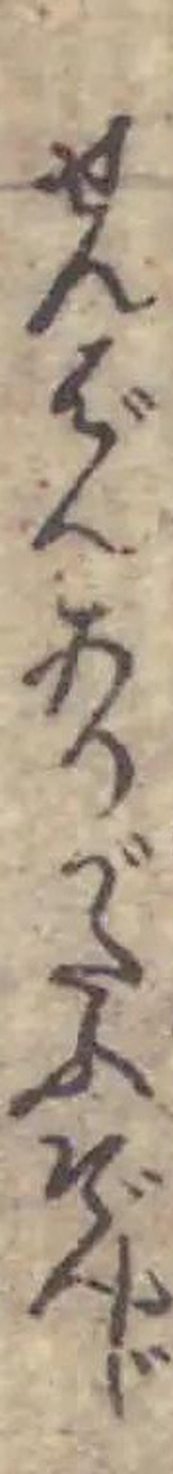せんばんありがたふぞんじ
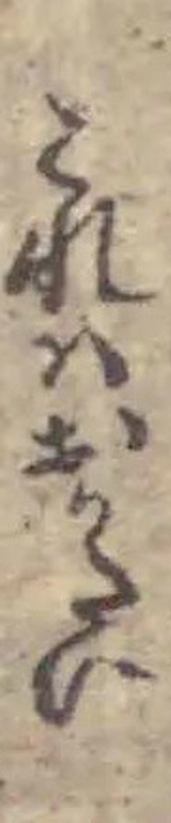これはおかたい
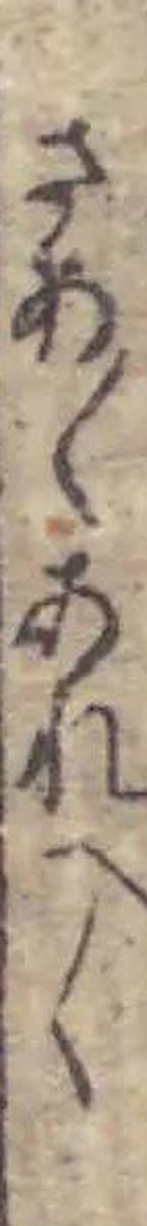さあ〳〵あれへ〳〵

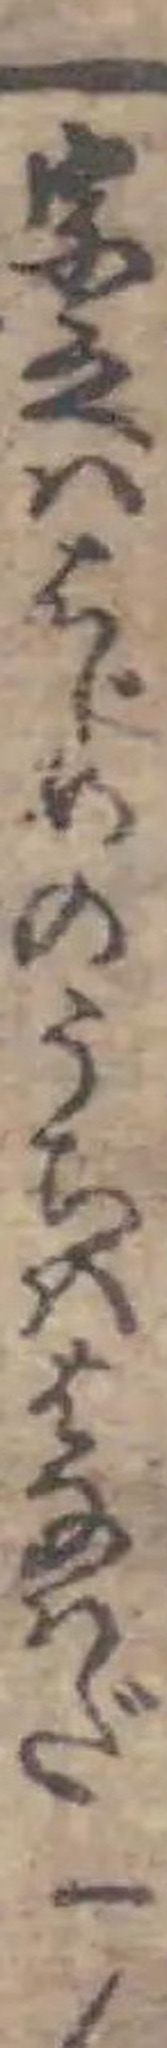宗之ははじめのうちははなはだ
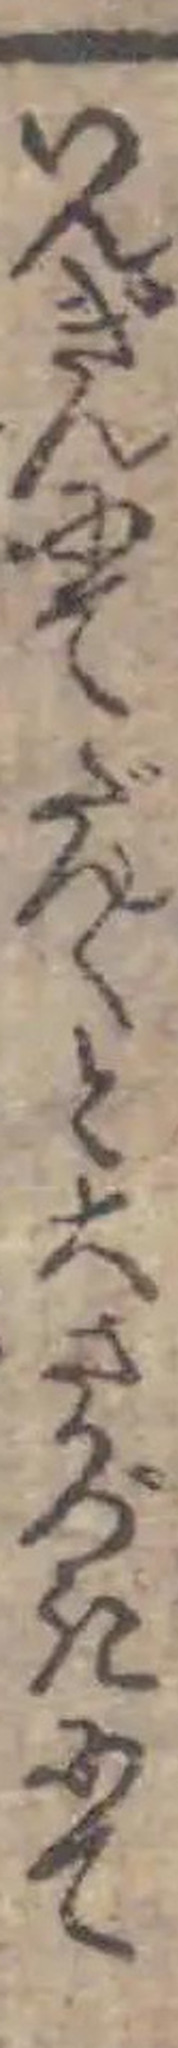いんぎんにてだん〳〵と大さかづきにて
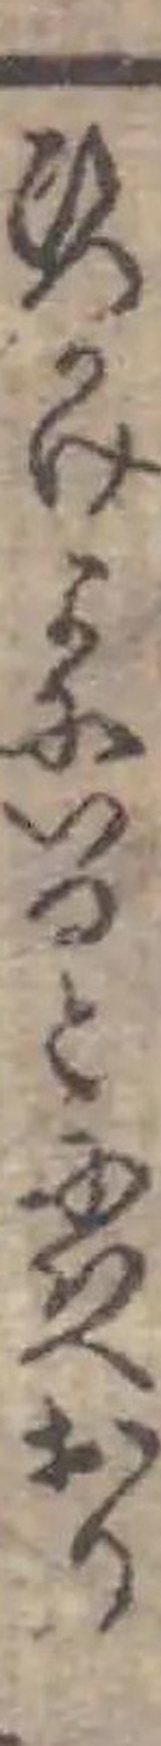ひつかけよにいるとにはへおり
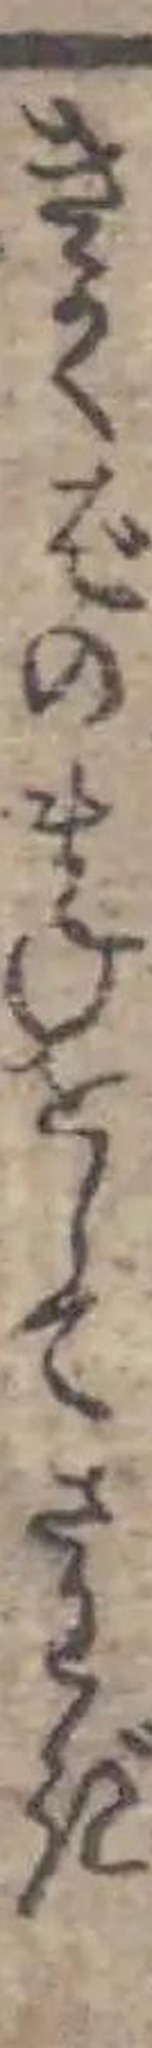きよくばのまねをしてさわぎ
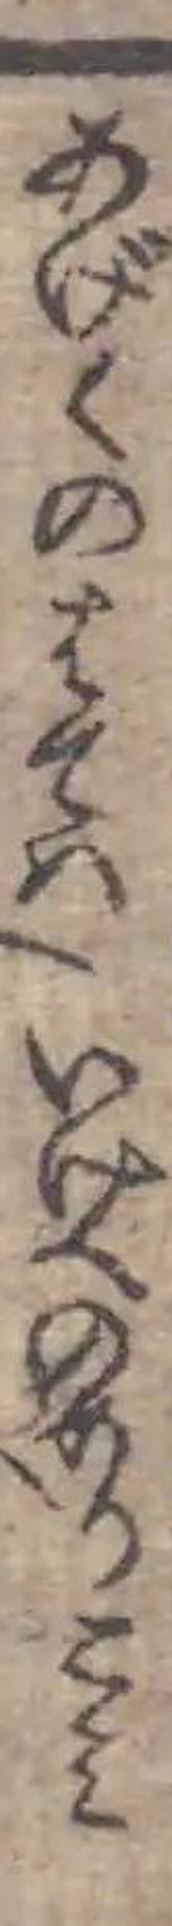あげくのはてはいけへのめりこみ
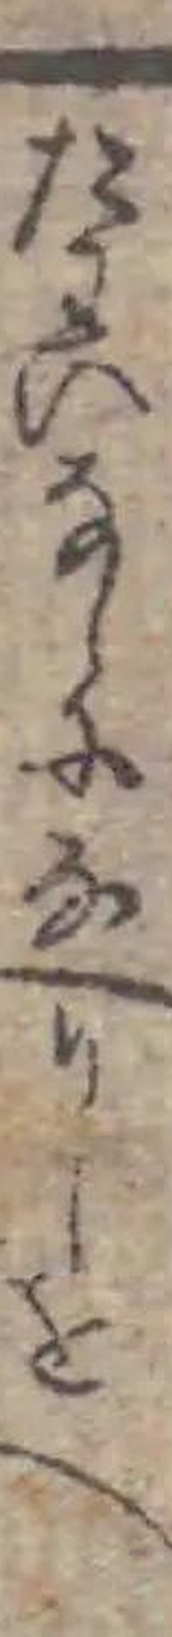たわいなしになりしを
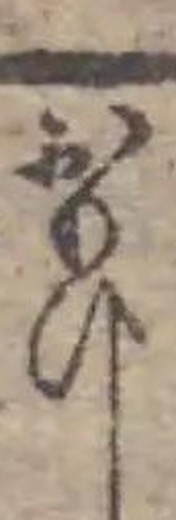おもひ
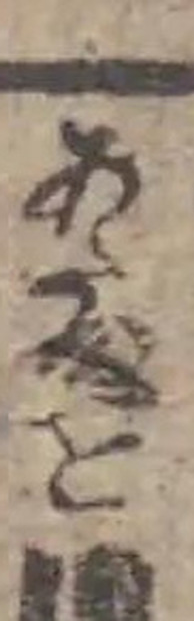あたまを
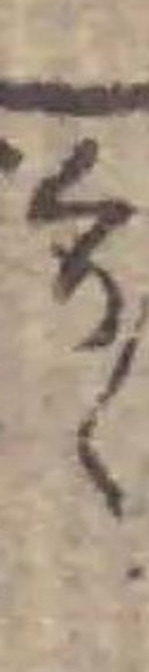くり〳〵
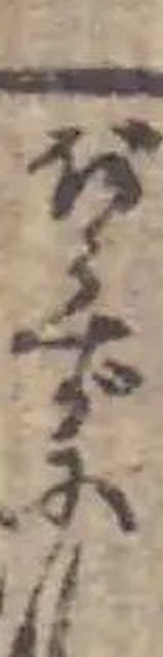ぼうずに
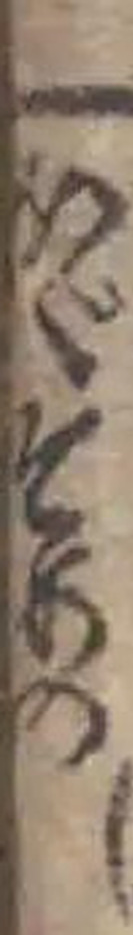ほぐそめの
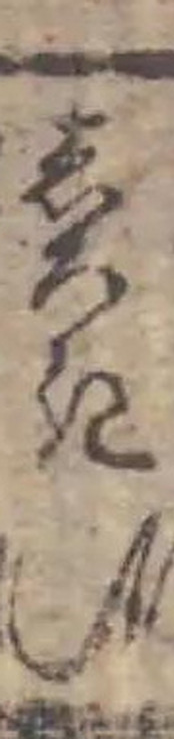しろき
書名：飲中八人前 3巻
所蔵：国立国会図書館 National Diet Library, JAPAN
